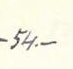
54
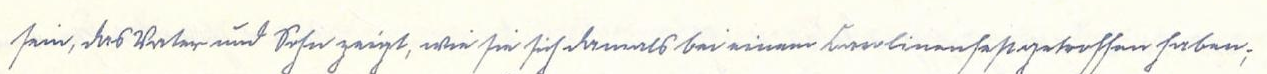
sein, das Vater und Sohn zeigt, wie sie sich damals bei einem Carolinenfest getroffen haben;
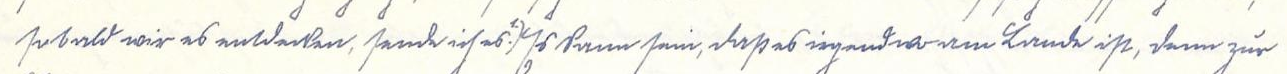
sobald wir es entdecken, sende ich es.1) Es kann sein, dass es irgendwo am Lande ist, denn zur
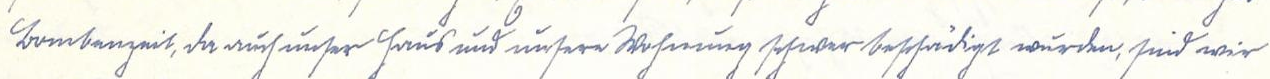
Bombenzeit, da auch unser Haus und unsere Wohnung schwer beschädigt wurden, sind wir
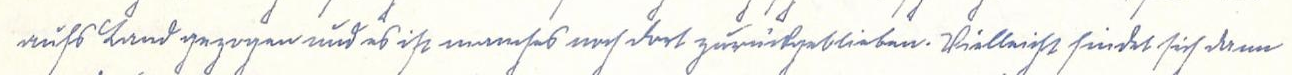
aufs Land gezogen und es ist manches noch dort zurückgeblieben. Vielleicht findet sich dann
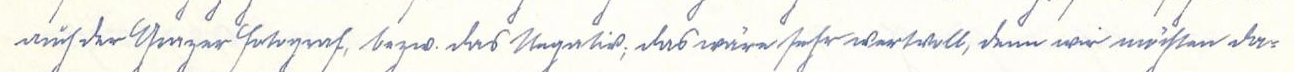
auch der Grazer Fotograf bzw. das Negativ; Das wäre sehr wertvoll, denn wir möchten da-
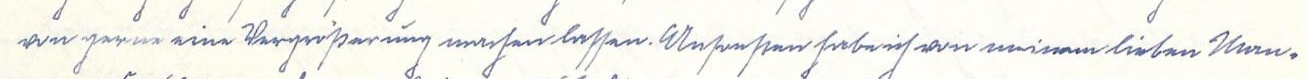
von gerne eine Vergrößerung machen lassen. Ansonsten habe ich von meinem lieben Man-
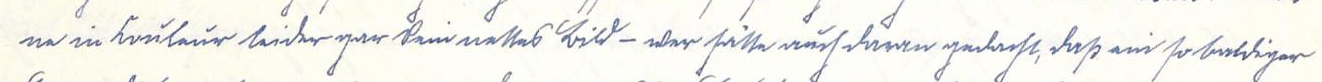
ne in Couleur leider gar kein nettes Bild - wer hätte auch daran gedacht, daß ein so baldiger
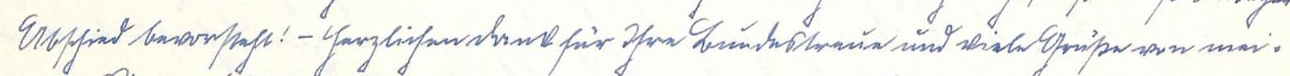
Abschied bevorsteht!- Herzlichen Dank für Ihren Bundestreue und viele Grüße von mei-
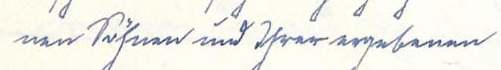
nem Söhnen und Ihrer ergebenen
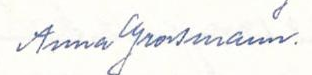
Anna Großmann.
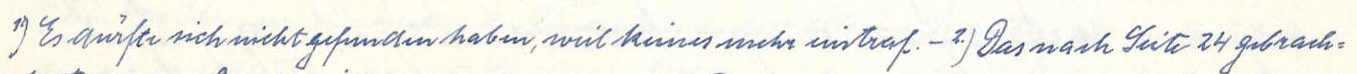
1) Es dürfte sich nicht gefunden haben, weil keines mehr eintraf.- 2) Das nach Seite 24 gebrach-
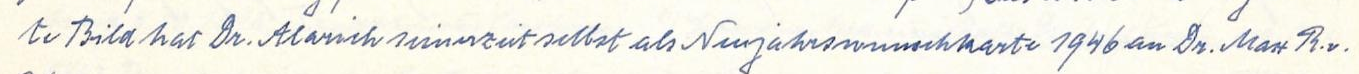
te Bild hat Dr. Heinrich seinerzeit selbst als Neujahrswunschkarte 1946 Dr. Max R. v.
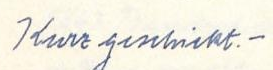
Kurz geschickt.
